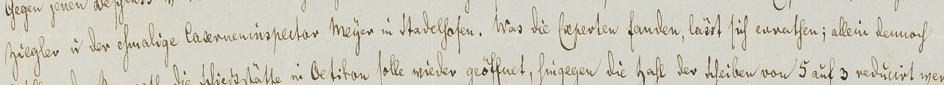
Ziegler u der ehemalige Caserneninspector Meyer in Stadelhofen. Was die Experten fanden, lässt sich errathen; allein dennoch
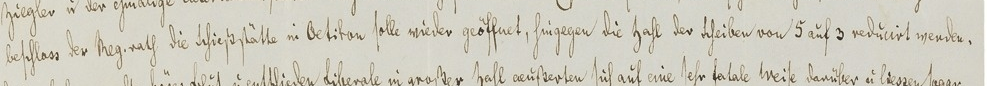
beschloss der Reg.rat die Schießstätte in Oetikon solle wieder geöffnet, hingegen die Zahl der Scheiben von 5 auf 3 reducirt werden.
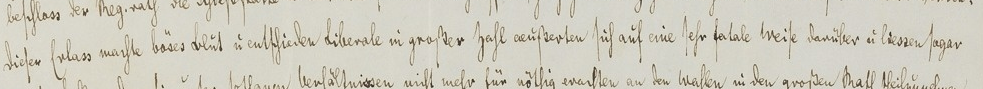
Dieser Erlass machte böses Blut u entschieden Liberale in großer Zahl aeußerten sich auf eine sehr fatale Weise darüber u liessen sogar
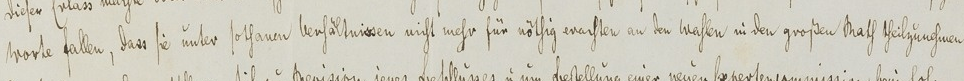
Worte fallen, dass sie unter sothanen Verhältnissen nicht mehr für nöthig erachten an den Wahlen in den großen Rath theilzunehmen.
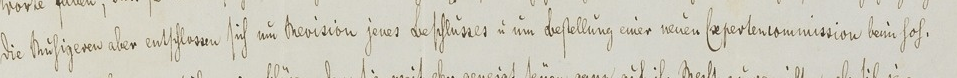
Die Ruhigeren aber entschlossen sich um Revision jenes Beschlusses u um Bestellung einer neuen Expertencommission beim hoh.
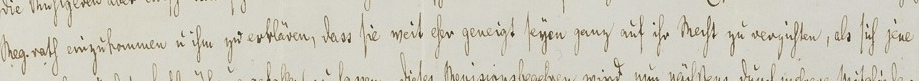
Reg.rath einzukommen u ihm zu erklären, dass sie weit eher geneigt seyen ganz auf ihr Recht zu verzichten, als sich jene
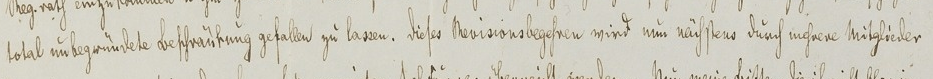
total unbegründete Beschränkung gefallen zu lassen. Dieses Revisionsbegehren wird nun nächstens durch mehrere Mitglieder
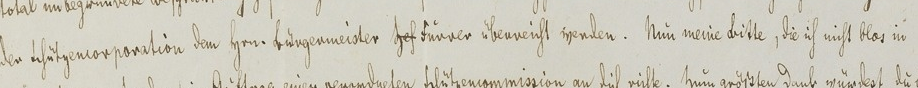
der Schützencorporation dem Hrn. Bürgermeister ...Furrer überreicht werden. Nun meine Bitte, die ich nicht blos in
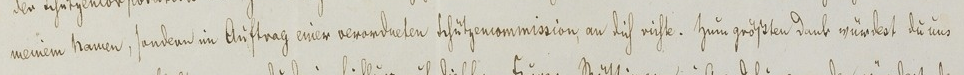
meinem Namen, sondern im Auftrag einer verordneten Schützencommission, an Dich richte. Zum größten Dank würdest Du uns
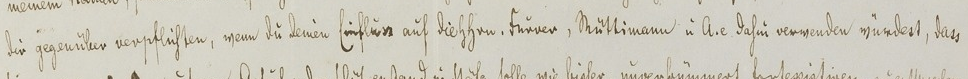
Dir gegenüber verpflichten, wenn Du Deinen Einfluss auf die HHrn. Furrer,Rüttimannu A.e dahin verwenden würdest, dass
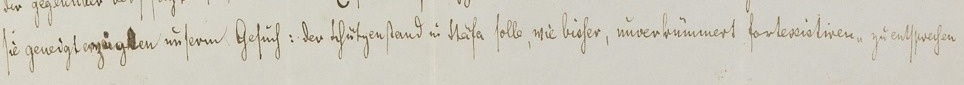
sie geneigt erzeigten unserm Gesuch: «der Schützenstand in Stäfa solle, wie bisher, unverkümmert fortexistiren» zu entsprechen
